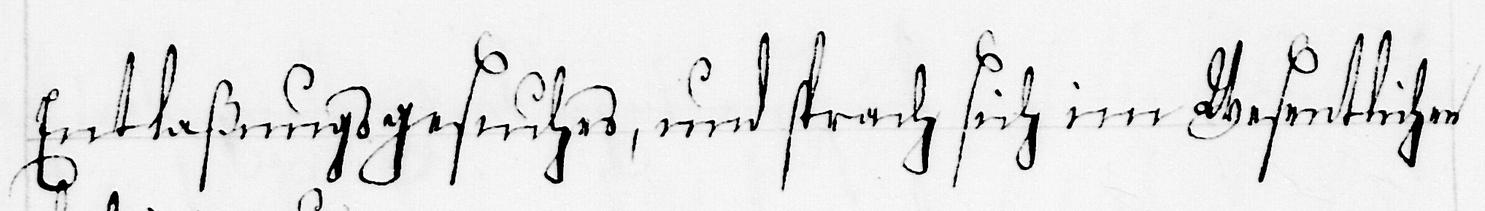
Entlaßungsgesuches, und sprach sich im Wesentlich¬
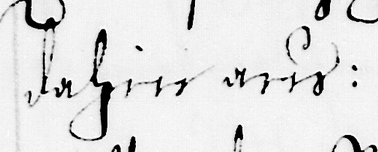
dahin aus:
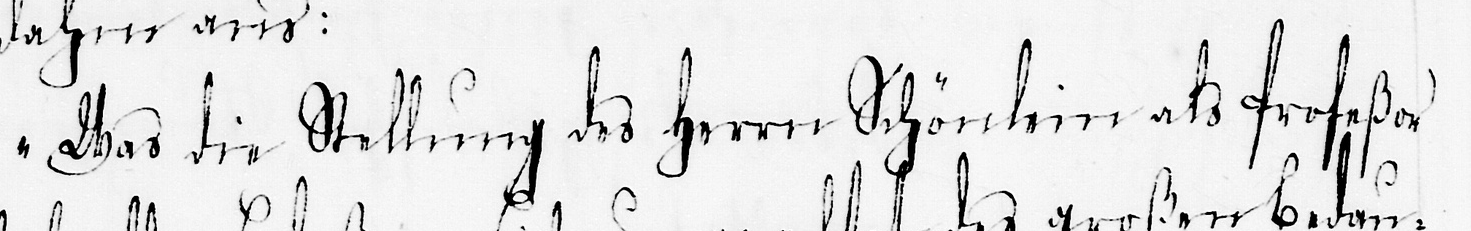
„Was die Stellung des Herrn Schönlein als Profeßor
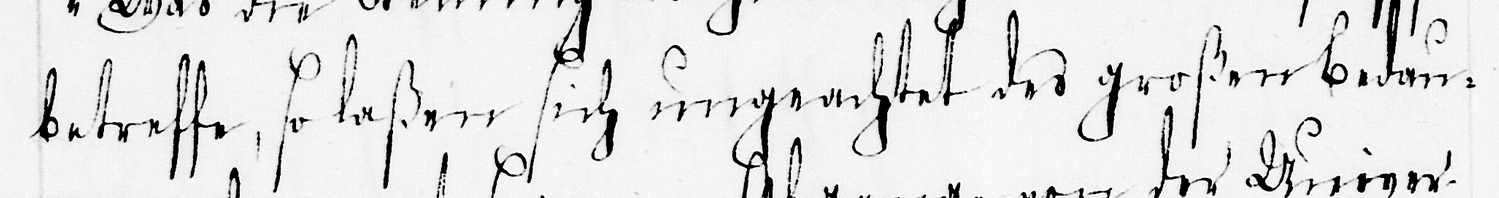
betreffe, so laßen sich ungeachtet des großen Bedau¬
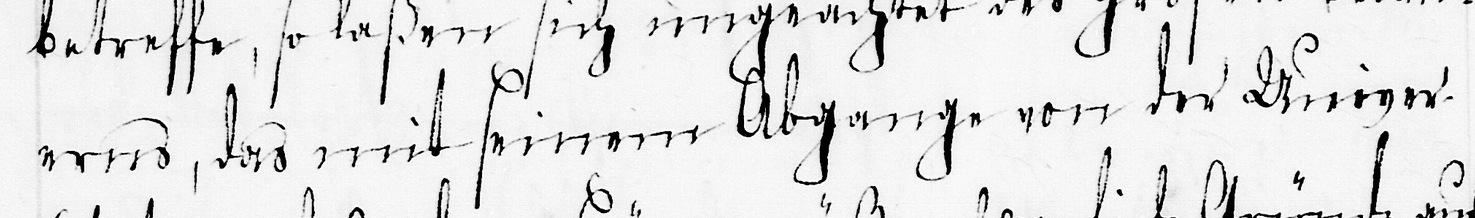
erns, das mit seinem Abgange von der Univer¬
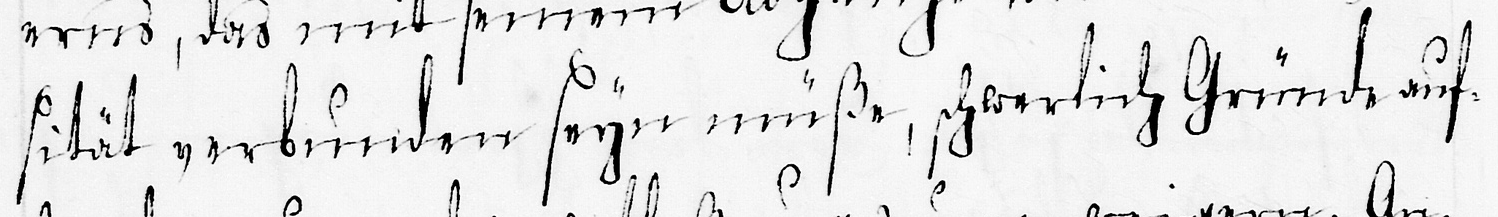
sität verbunden seyn müße, schwerlich Gründe auf¬
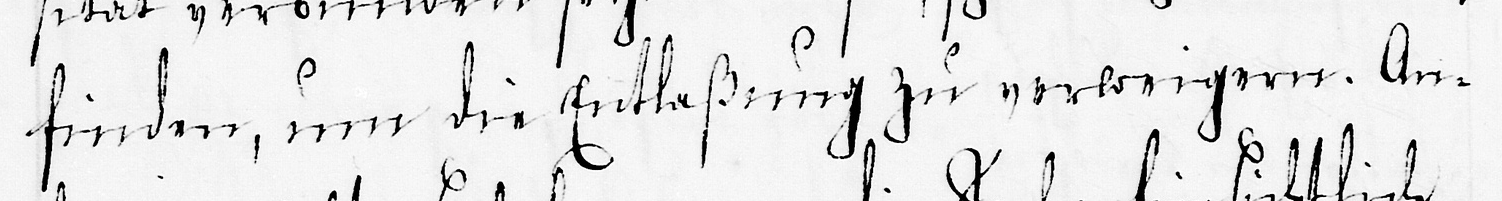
finden, um die Entlaßung zu verweigern. An¬
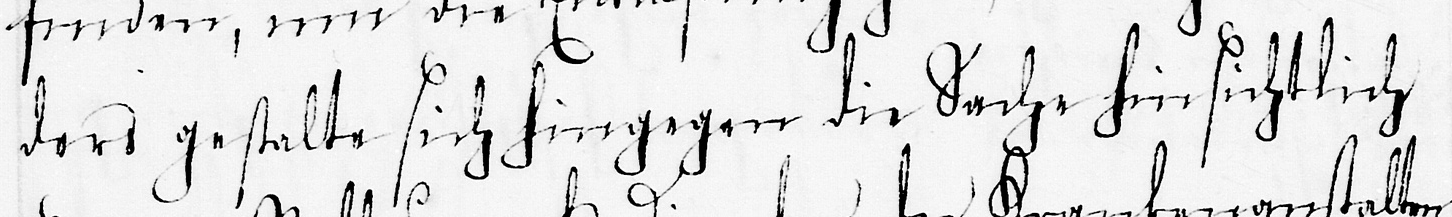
ders gestalte sich hingegen die Sache hinsichtlich
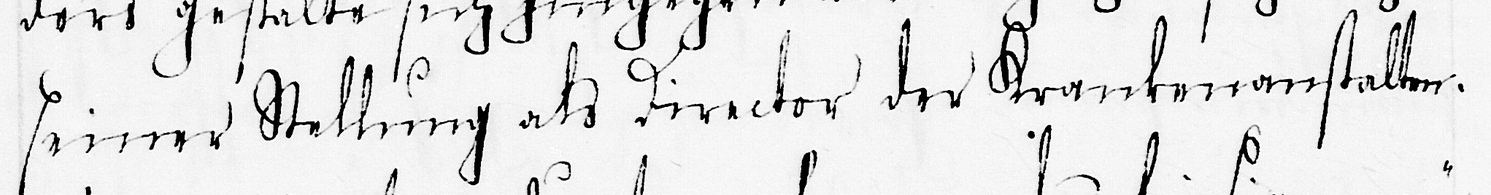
seiner Stellung als Director der Krankenanstalten.
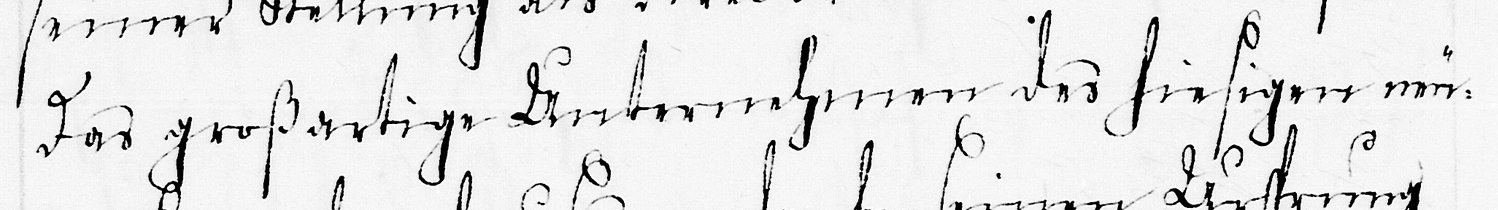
Das großartige Unternehmen des hiesigen neu¬
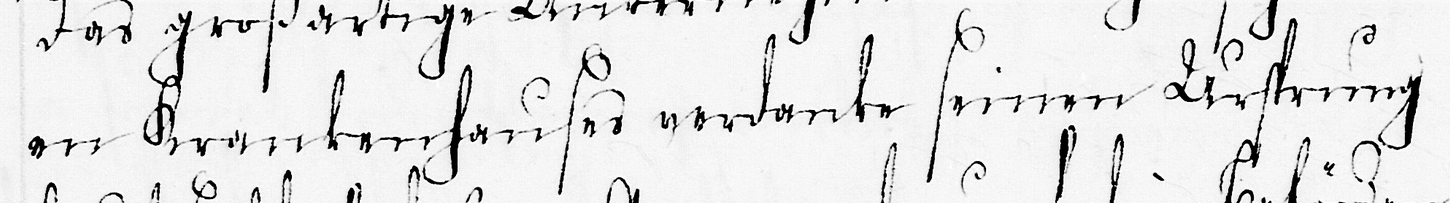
en Krankenhauses verdanke seinen Ursprung
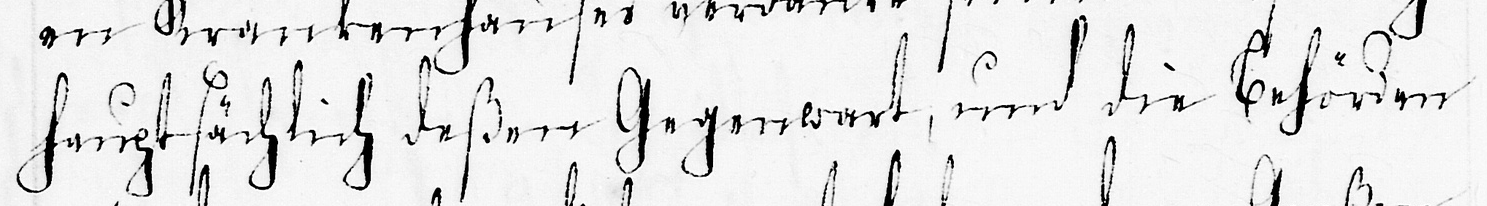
hauptsächlich deßen Gegenwart, und die Behörden
